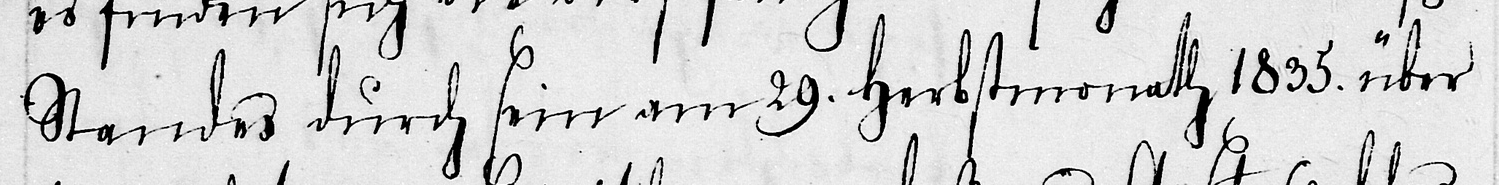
Standes durch sein am 29. Herbstmonath 1835. über
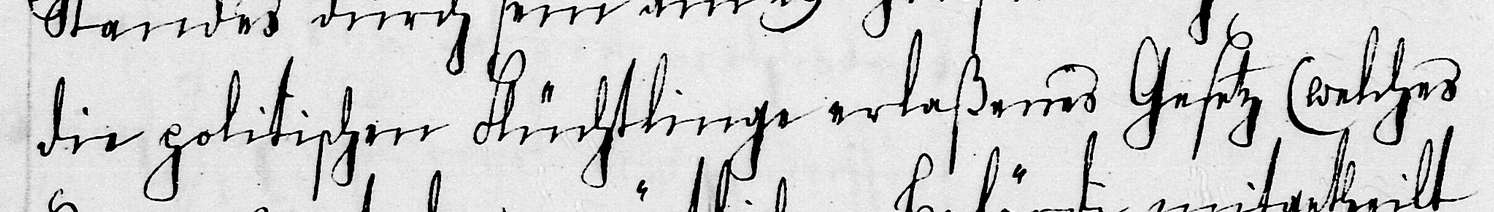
die politischen Flüchtlinge erlaßenes Gesetz (welches
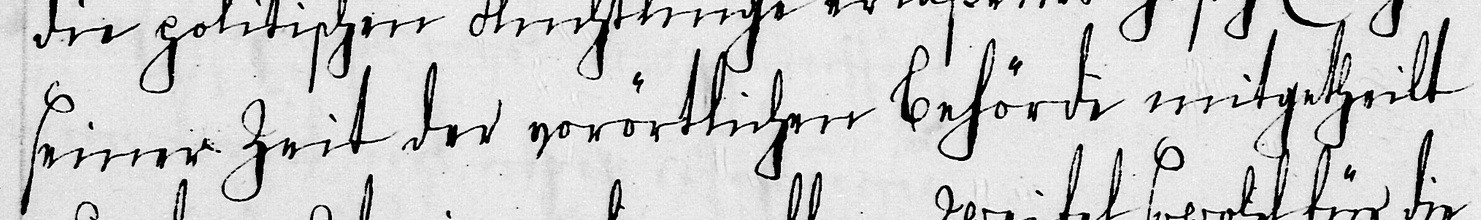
seiner Zeit der vorörtlichen Behörde mitgetheilt
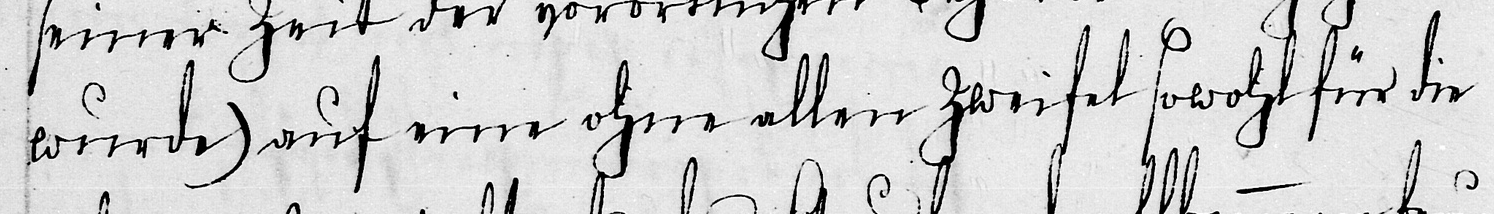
wurde) auf eine ohne allen Zweifel sowohl für die
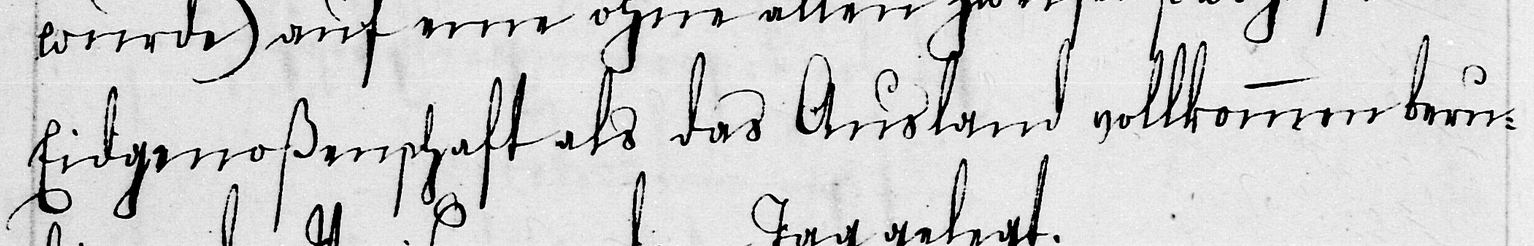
Eidgenoßenschaft als das Ausland vollkommen beru¬
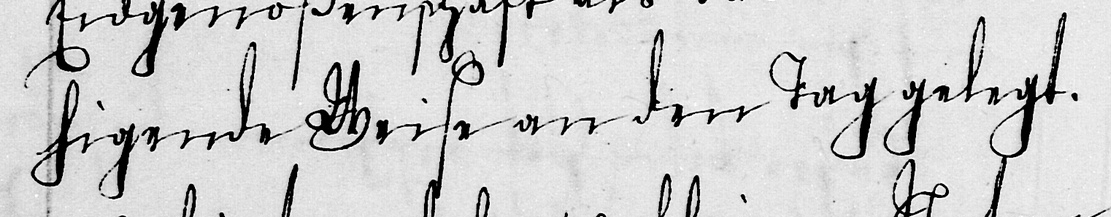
higende Weise an den Tag gelegt.
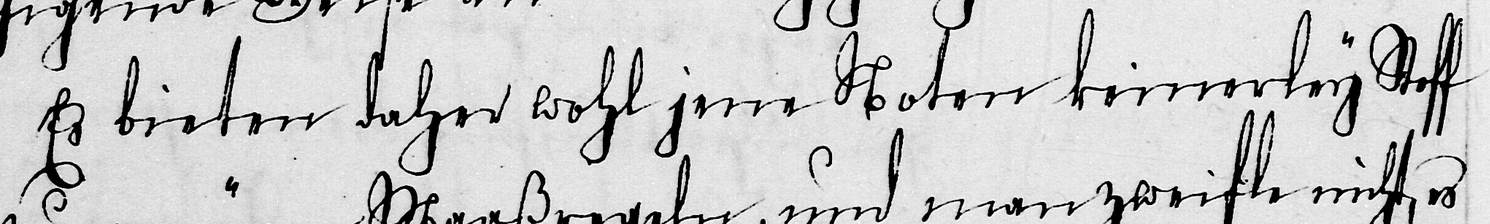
Es bieten daher wohl jene Noten keinerley Stoff
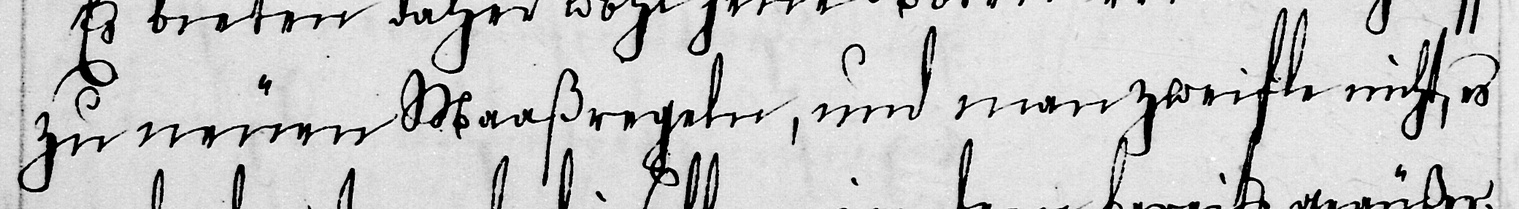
zu neuen Maaßregeln, und man zweifle nicht, es
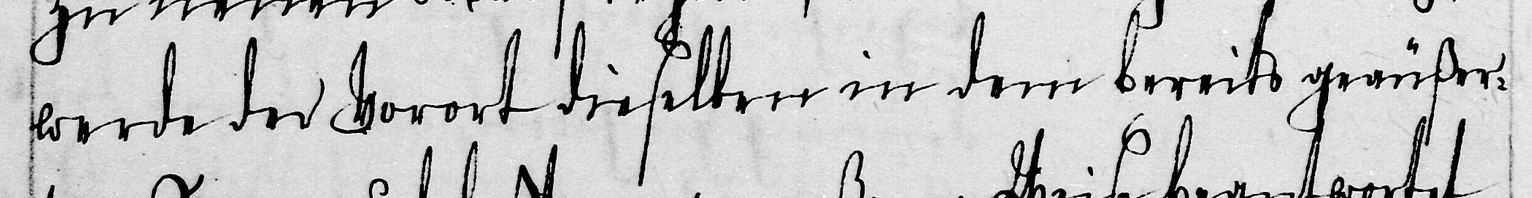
werde der Vorort dieselben in dem bereits geäußer¬
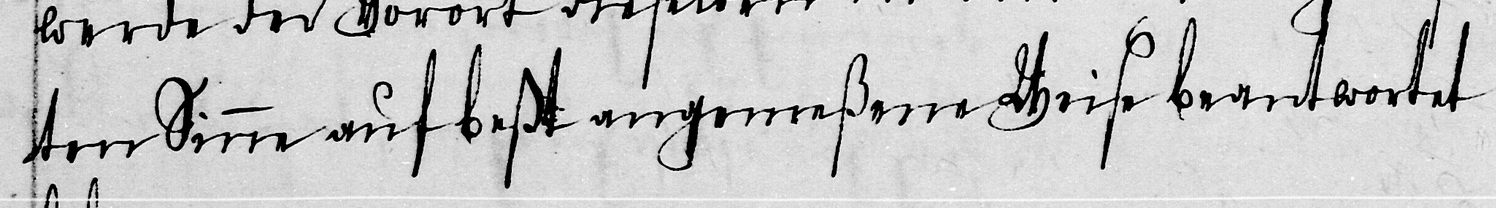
ten Sinne auf beßt angemeßene Weise beantwortet
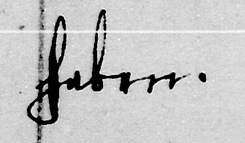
haben.
